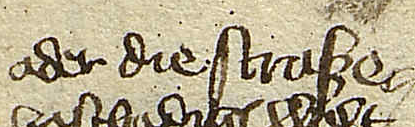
oder die ſtraſʒe
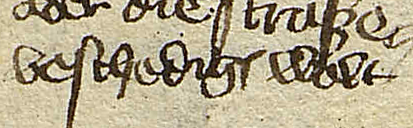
beſchedig* wolt
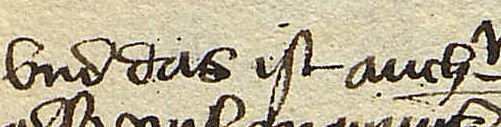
vnd das iſt auch
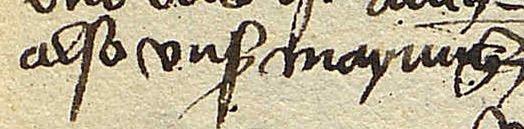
alſo vnſ* maynug*
